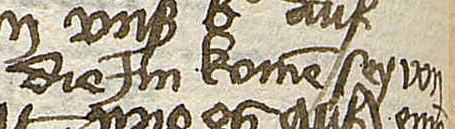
die Im kome* ſey von
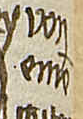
eine*
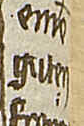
guten
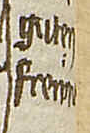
frewnd
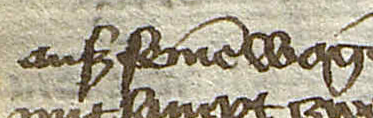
auſʒ ſeine* wage*
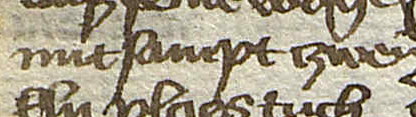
mitſampt cʒwein
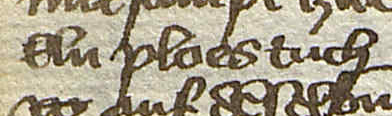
Eln ploes tuch
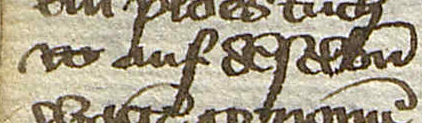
vo auf de*ſelb*n
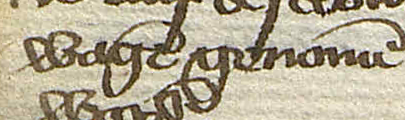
wage* genome*
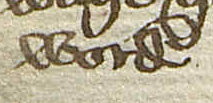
worde*
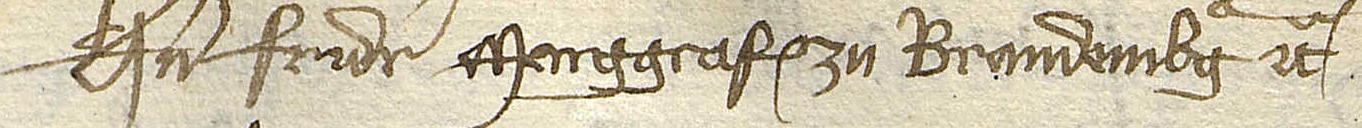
Hn* fridr* Marggraf* ʒu Brandembg* ec*
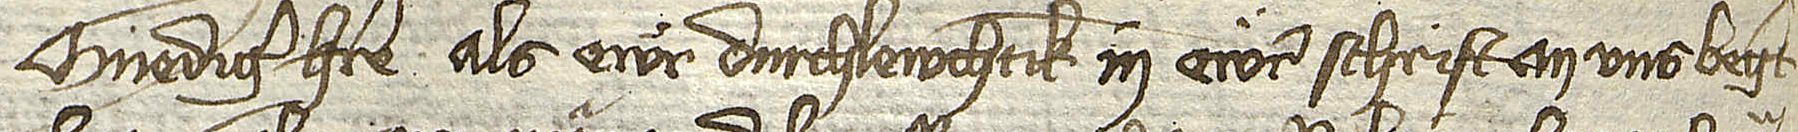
Gnedig* hre* als ewr durchlewchtik* in ewr* ſchrift an vns beg*t
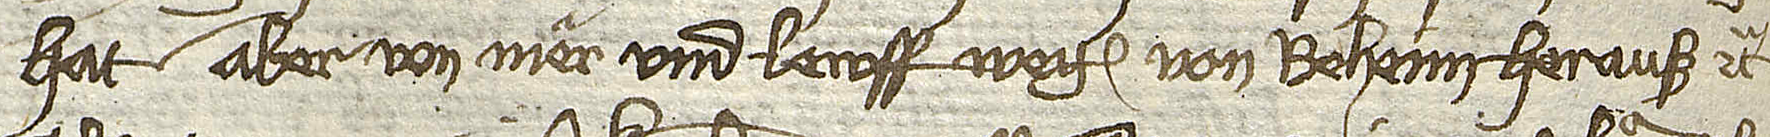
hat / aber von mër vnd lewff weg* von Beheim herauſʒ ec*
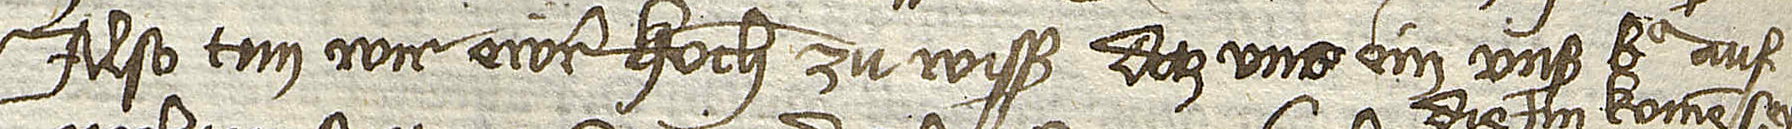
Alſo tun wir ewr* hoch* ʒu wiſſ* daʒ vns ein vnſ* b* auf
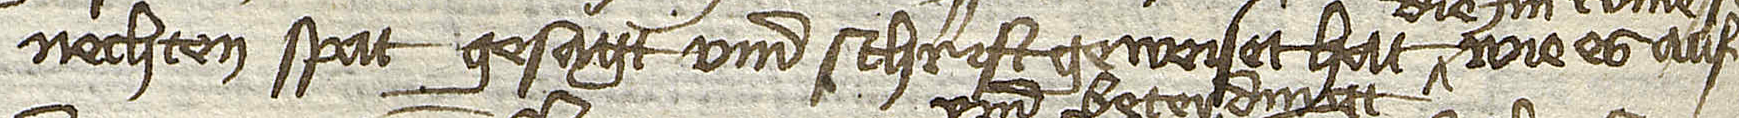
nechten ſpat geſagt vnd ſchrift geweiſet hat wie es auf
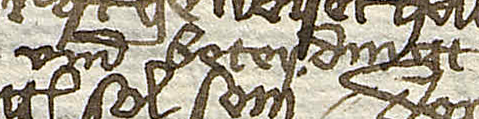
vnd beteydingt
